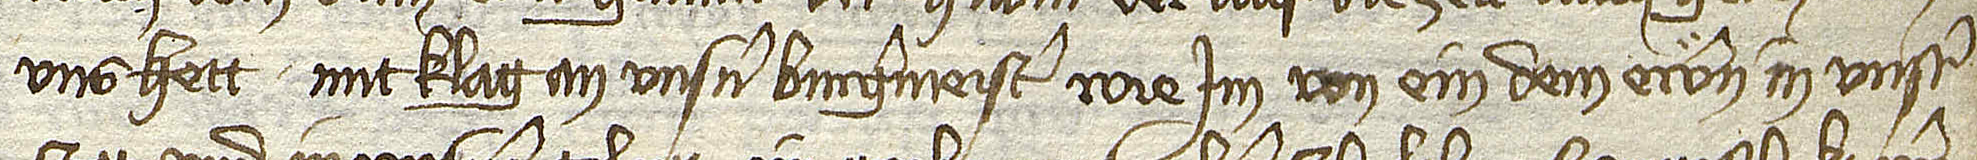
vns hett / mit klag an vnſ*n burgmeiſt* wie Im von ein dem ew*n in vnſ*r
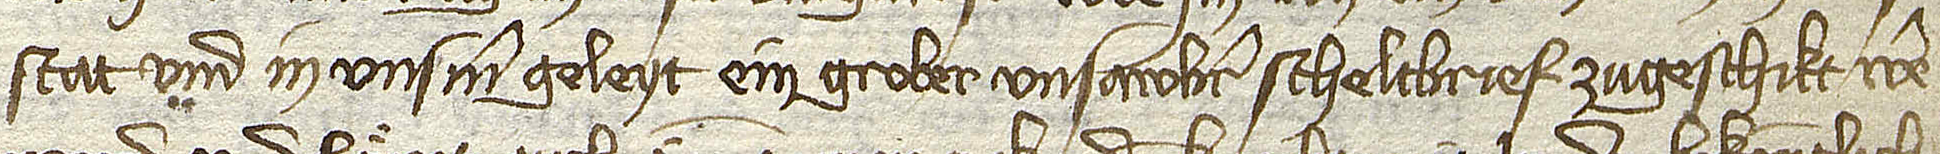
ſtat vnd in vnſ*m geleyt ein grober vnſawbr* ſcheltbrief ʒugeſchikt we*
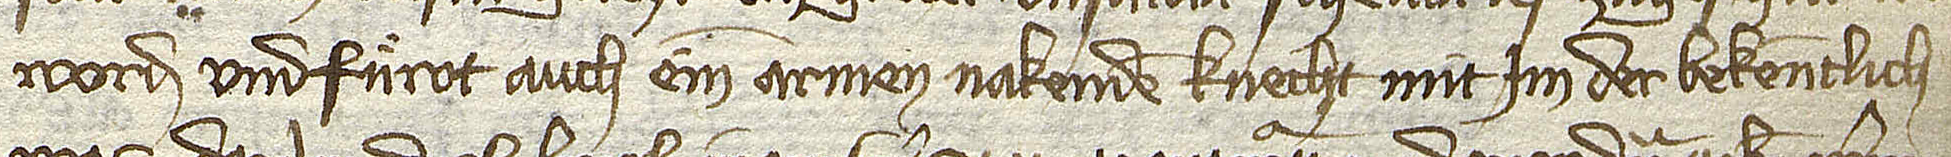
word* vnd füret auch ein* armen nakende* knecht mit Im der beken*tlich
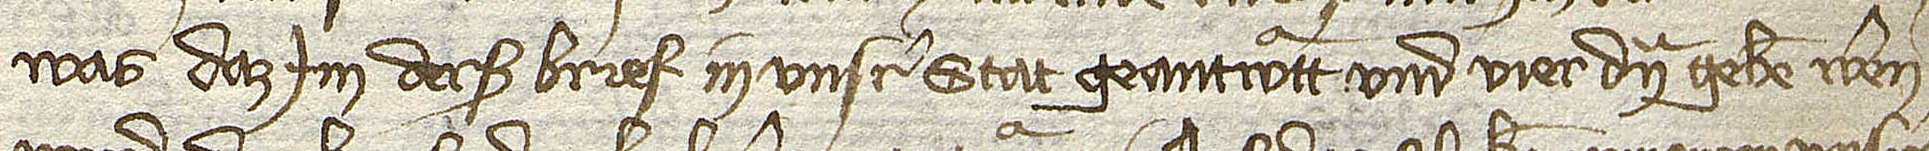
was daʒ Im derſ* brief in vnſ*r Stat geantw*tt vnd vier dn* gebe* w*en
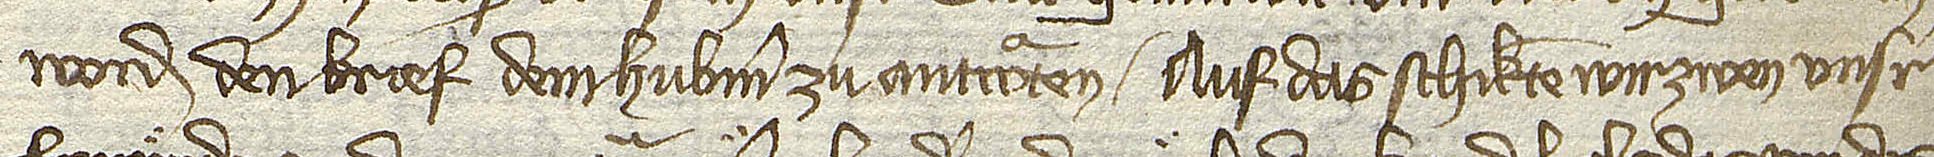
word* den brief dem hubm* ʒu antw*ten / Auf das ſchikte* wir ʒwen vnſ*r
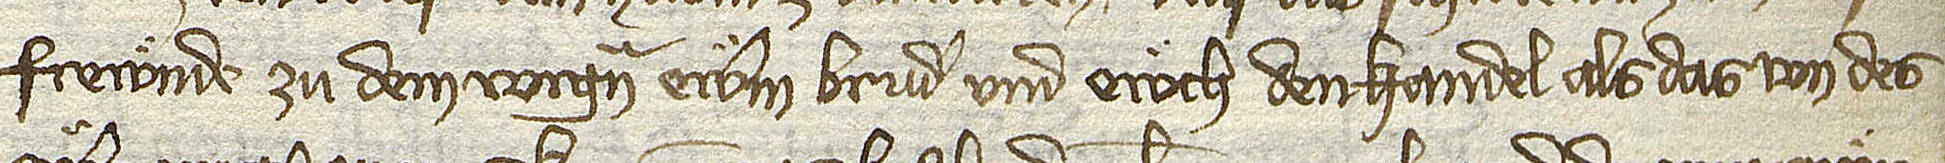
frewnde ʒu dem vorgn* ew*n brud* vnd ewch den handel als das von des
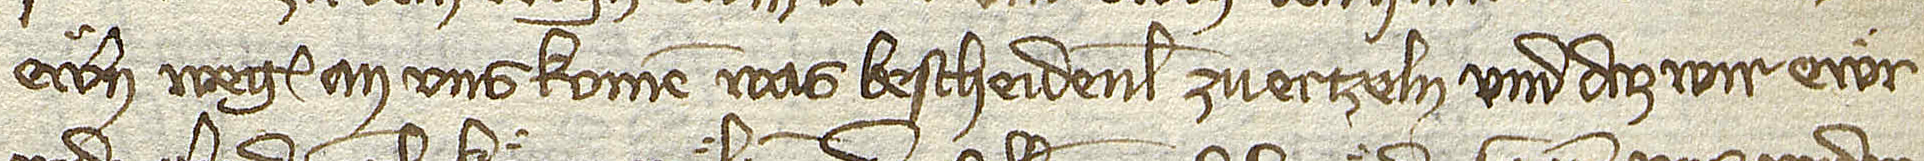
ew*n weg* an vns kome* was beſcheidenl* ʒuercʒeln vnd daʒ wir ewr
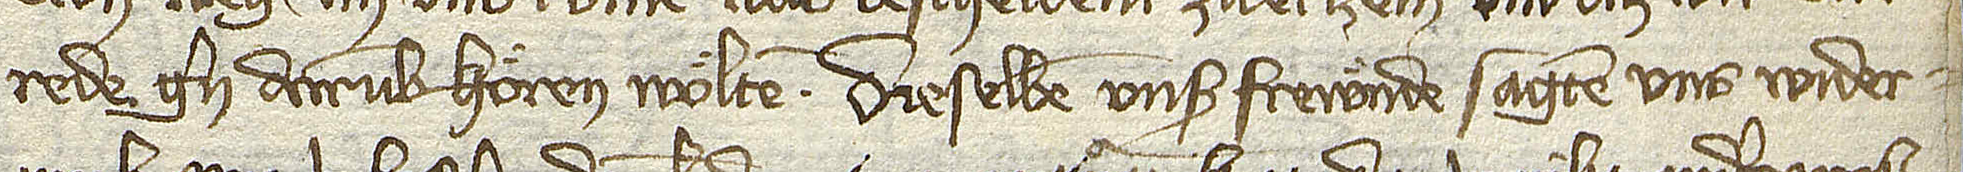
rede g*n daru*b hören wölte* . Dieſelbe* vnſ* frewnde ſagte* vns wider =
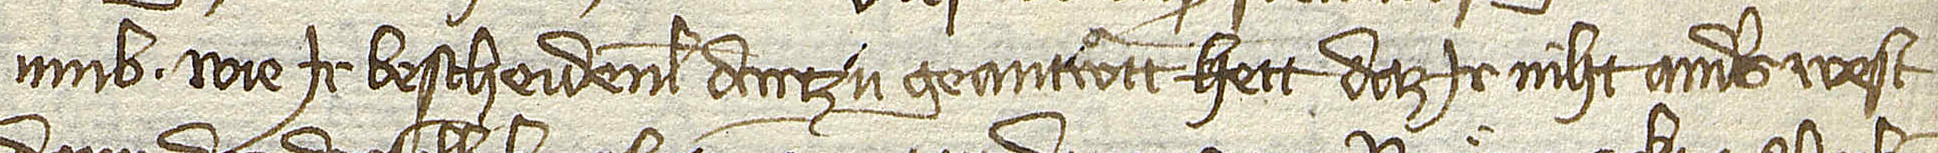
umb . wie Ir beſcheidenl* darcʒu geantw*tt hett daʒ Ir niht and*s weſt
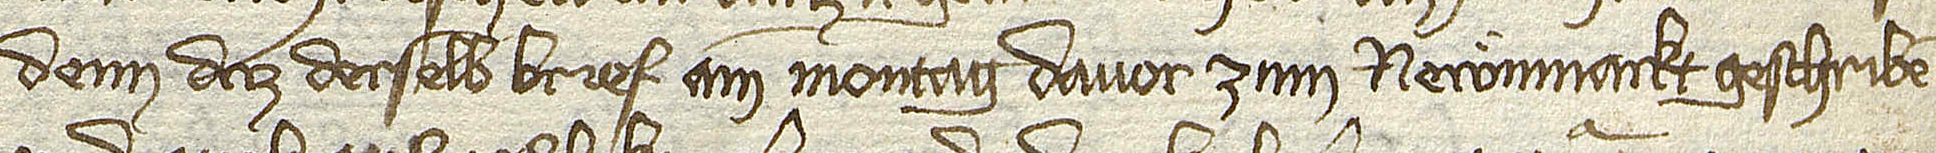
denn daʒ derſelb brief am* montag dauor ʒum Newnmarkt geſchribe*
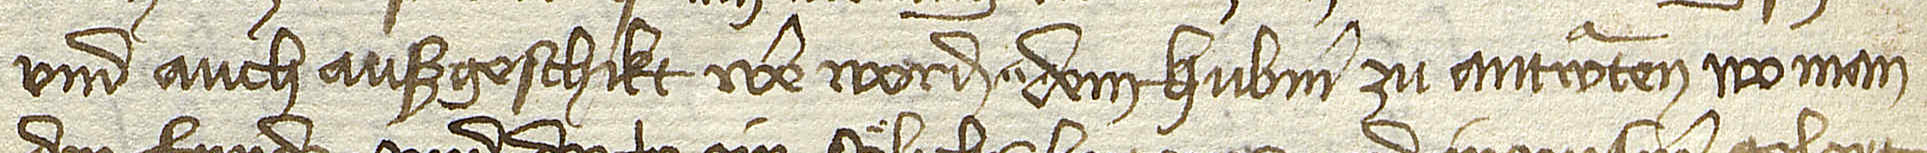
vnd auch auſʒgeſchikt w*e word* ~ dem hubm* ʒu antw*ten wo man
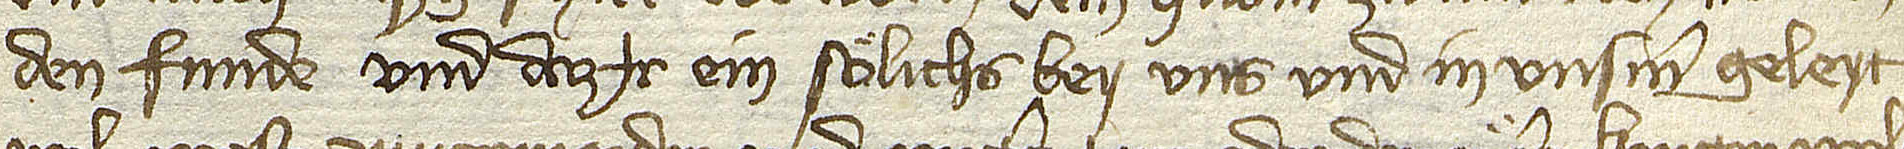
den funde vnd daʒ Ir ein ſölichs bey vns vnd in vnſ*m geleyt
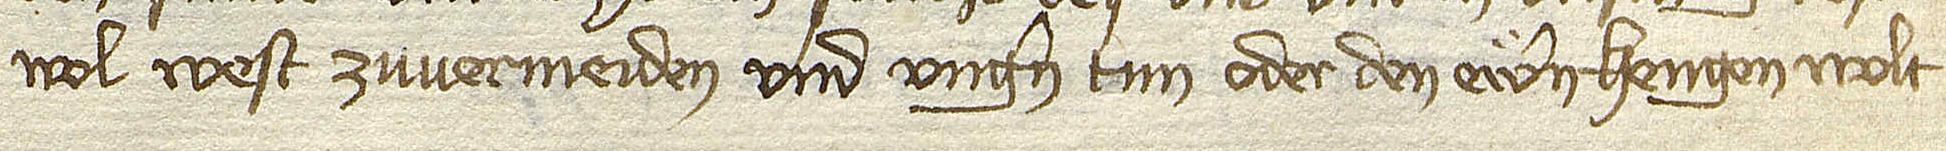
wol weſt ʒuuermeiden vnd vng*n tun oder den ew*n hengen wolt
